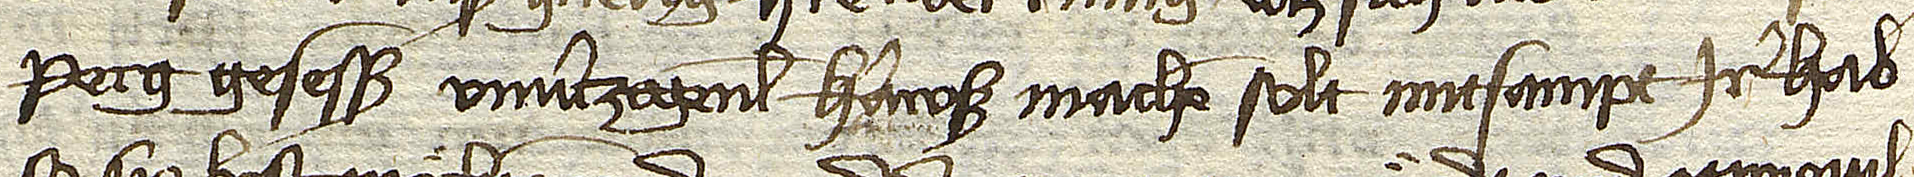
Perg geſeſſ* vnu*cʒogenl* h*awſʒ mache* ſolt mitſampt Ir* hab
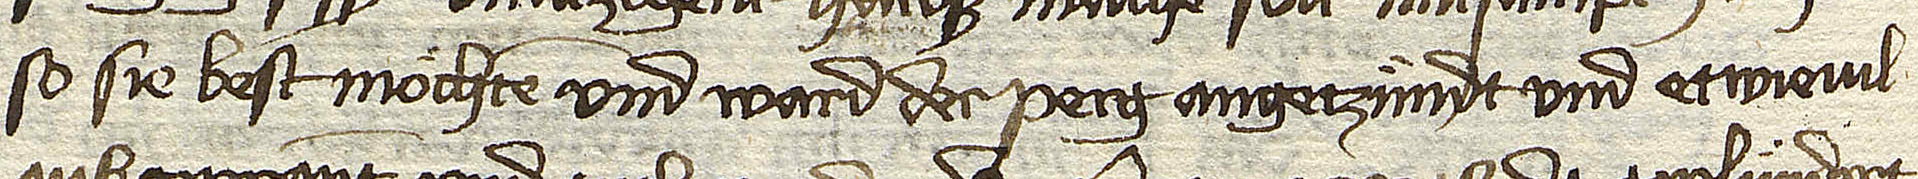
ſo ſie beſt möchte* vnd ward der perg angecʒündt vnd etwieuil
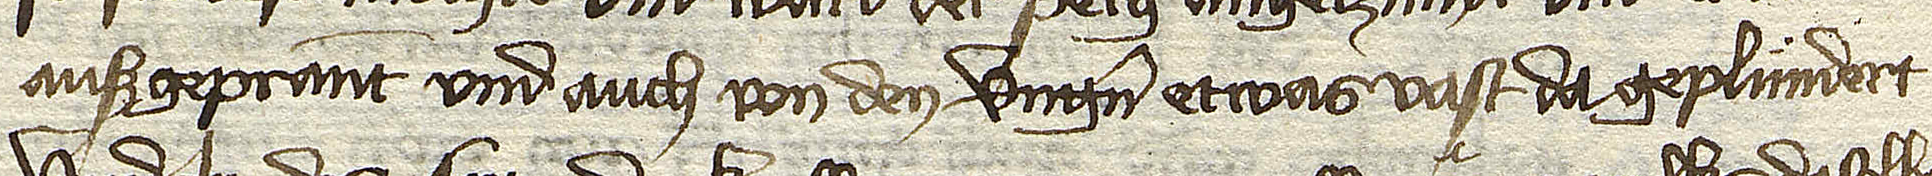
auſʒgepran*t vnd auch von den Vng*n etwas vaſt da geplündert
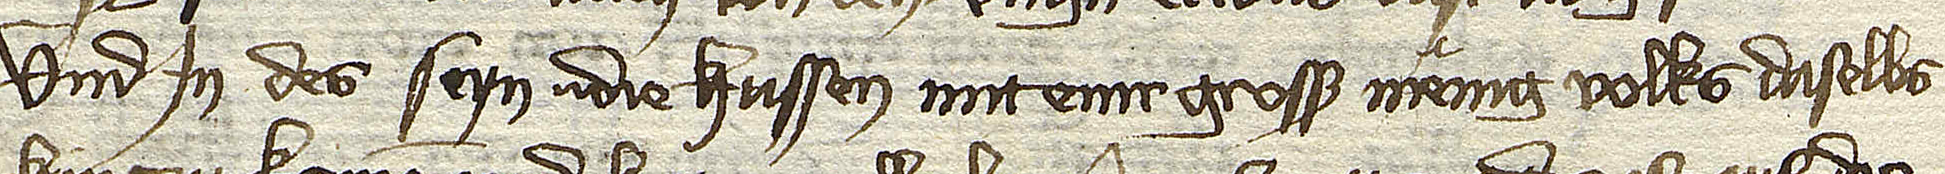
Vnd In des ſeyn ~ die huſſen mit einr groſſ mënig volks daſelbs
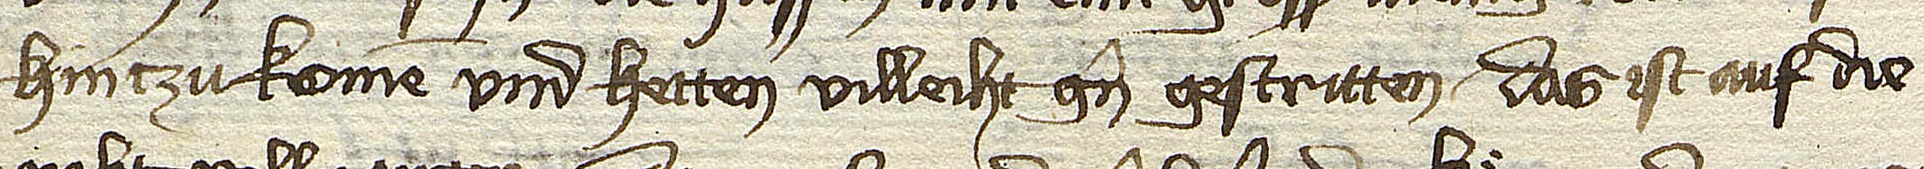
hincʒu kome* vnd hetten villeiht g*n geſtritten / das iſt auf die
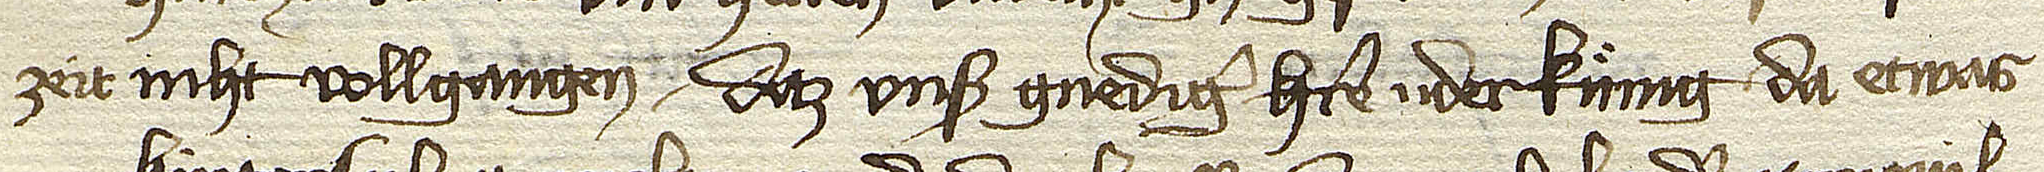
ʒeit niht vollgangen / Daʒ vnſ* gnedig* h*re ~ der künig da etwas
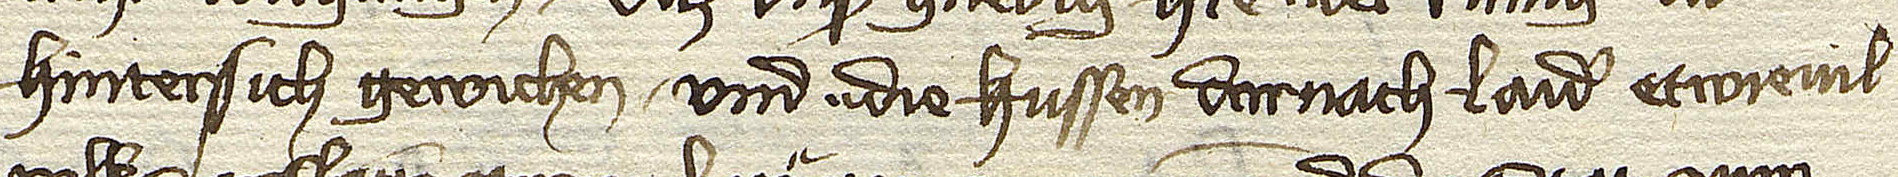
hinter ſich gewichen / vnd ~ die huſſen darnach laid* etwieuil
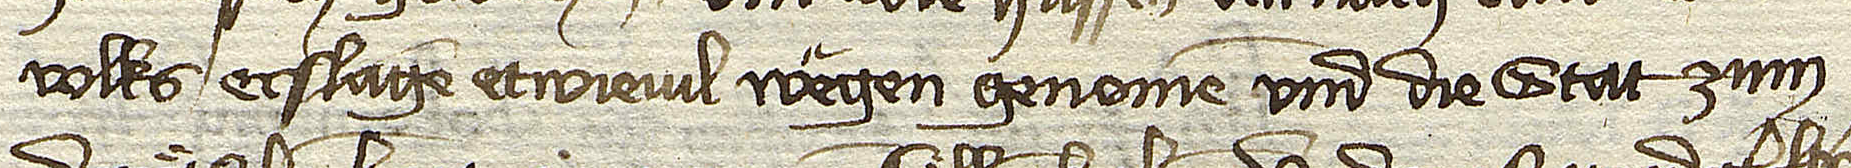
volks erſlage* etwieuil wëgen genome* vnd die Stat ʒum
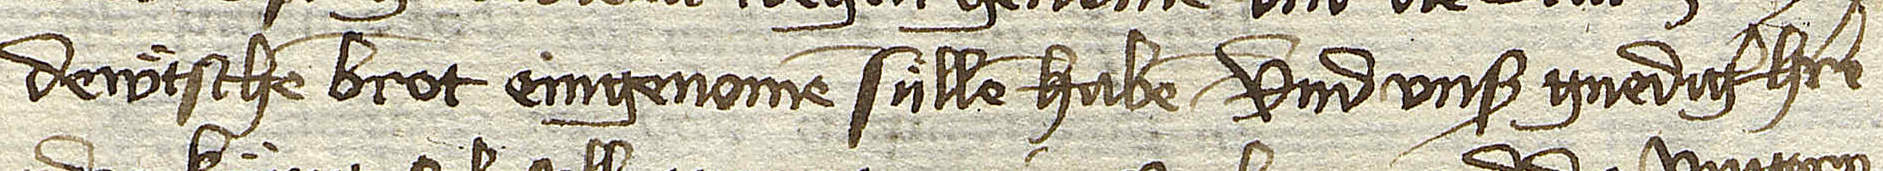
dewtſche* brot eingenome* ſülle* habe* / Vnd vnſ*r gnedig* h*re
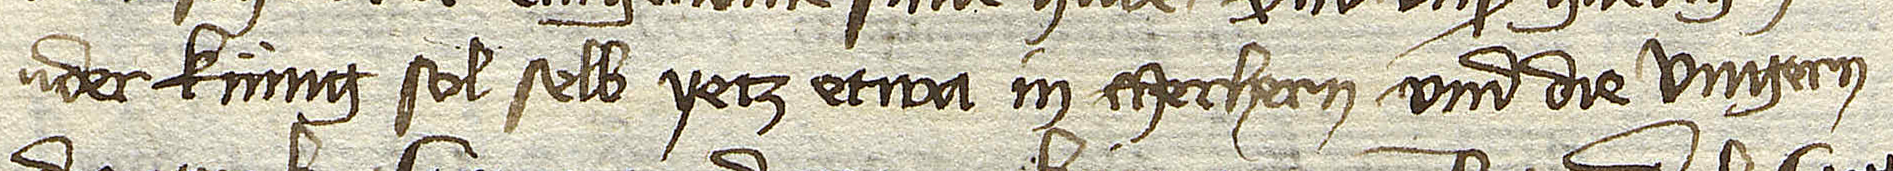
~ der künig ſol ſelb yecʒ etwa in Merhern vnd die Vngern
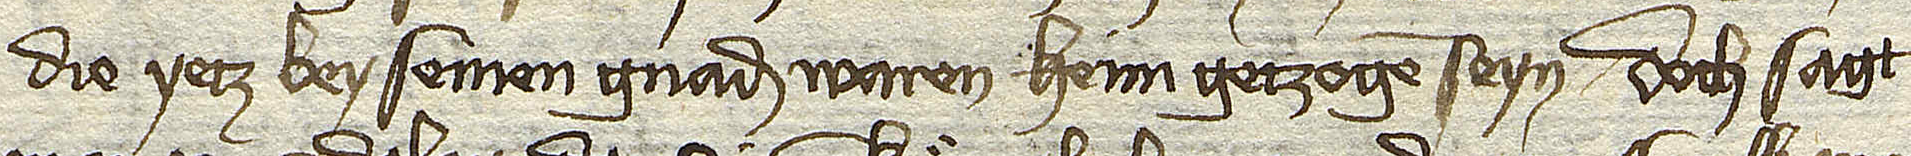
die yecʒ bey ſeinen gnad* waren heim gecʒoge* ſeyn / Doch ſagt
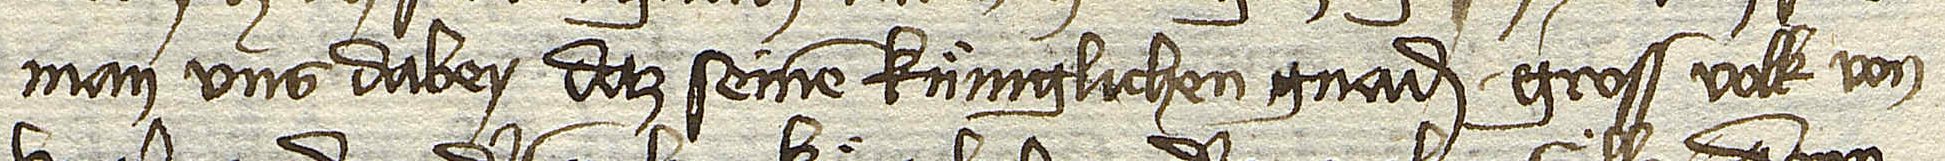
man vns dabey daʒ ſeine* küniglichen gnad* / groſſ volk von
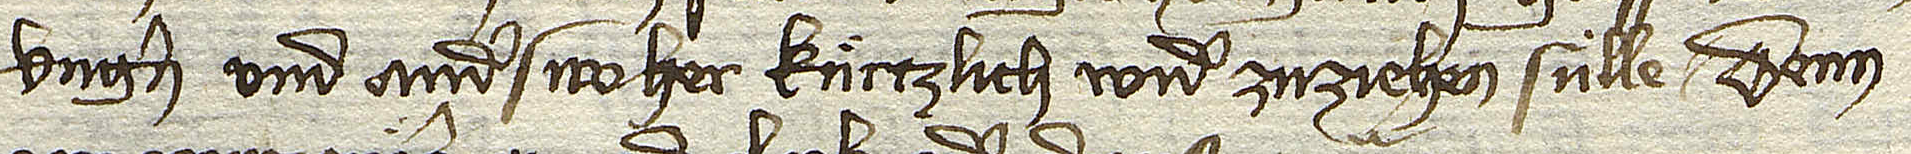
Vng*n vnd and*ſwoher kürcʒlich wid* ʒuʒiehen ſülle / Denn
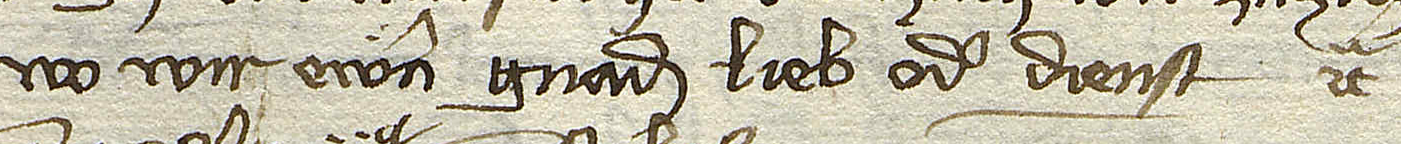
wo wir ew*n gnad* lieb od* dienſt ec*
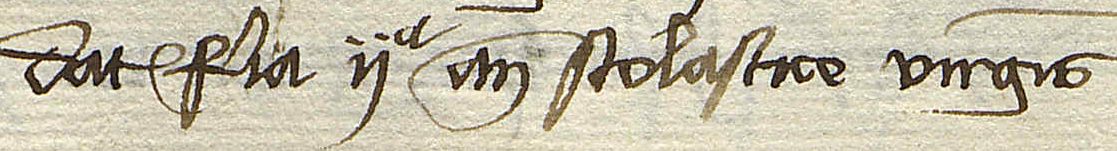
Dat* fia* ii* an* ſcolaſtice virg*is
